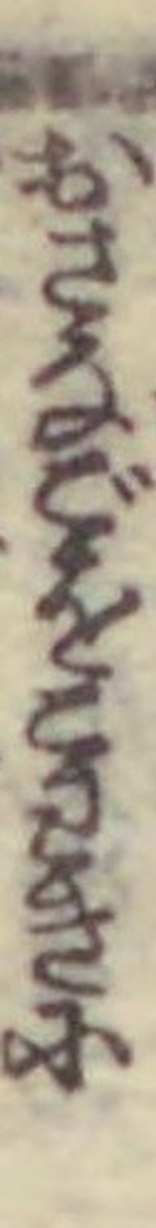おさなごをこわきに
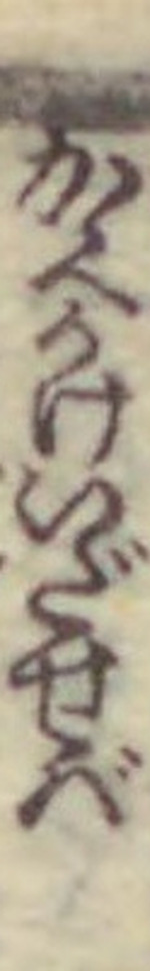かゝへかけいだせば
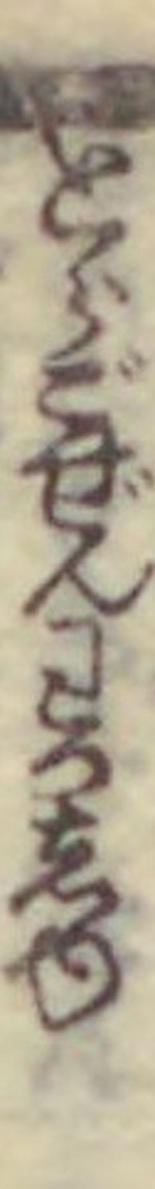とらごぜんわかしゆ
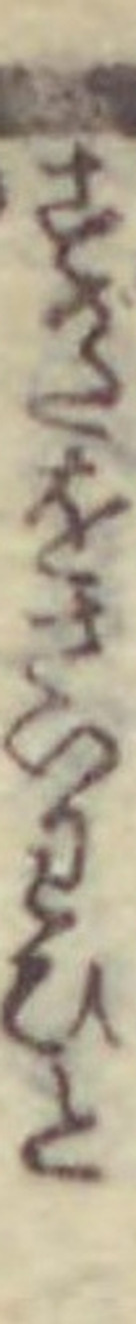すがたをさいわひと
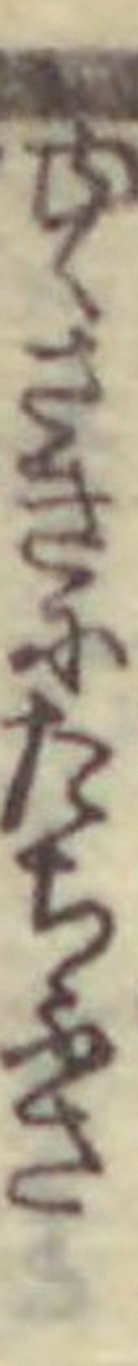ゆくさきにたちふさ
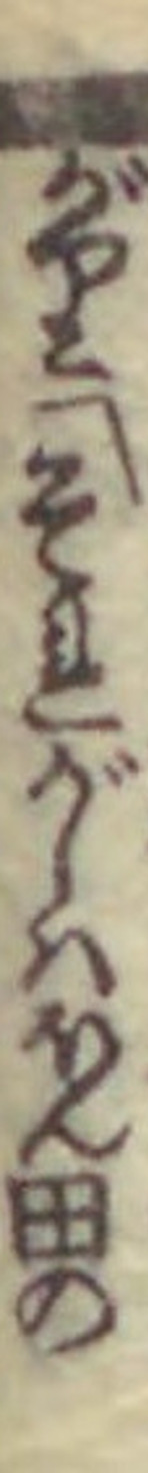がり〽それがしはほん田の
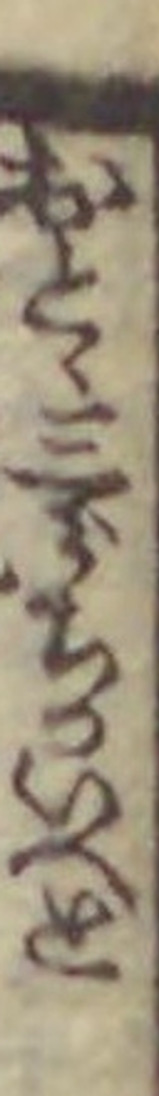おとゝ三郎ちかいへと
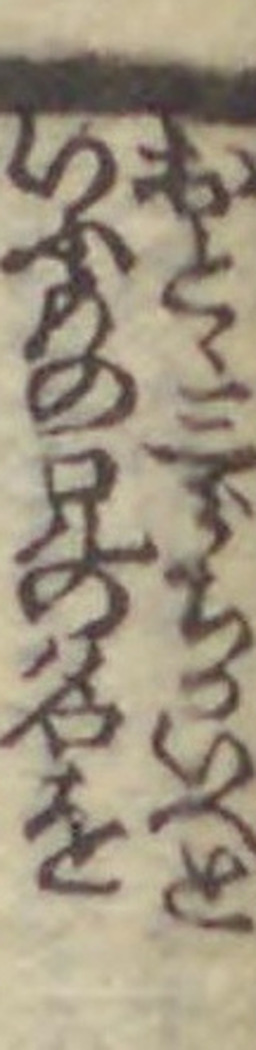いふもの兄の名を
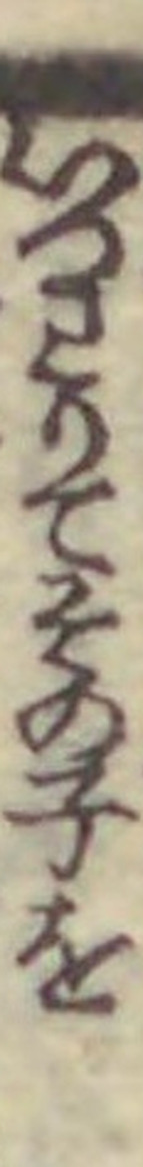いつわりてその子を
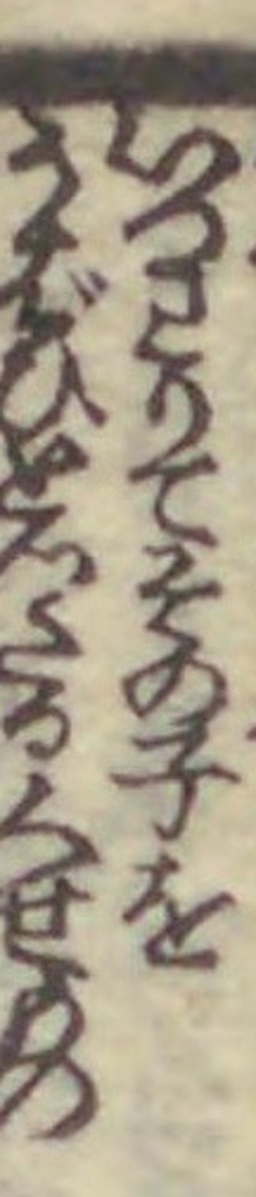うばひとつたるくせもの
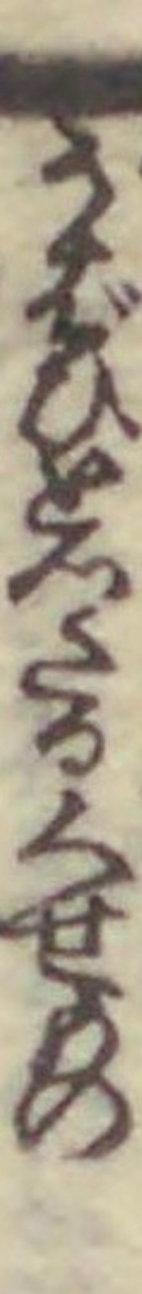うばひとつたるくせもの
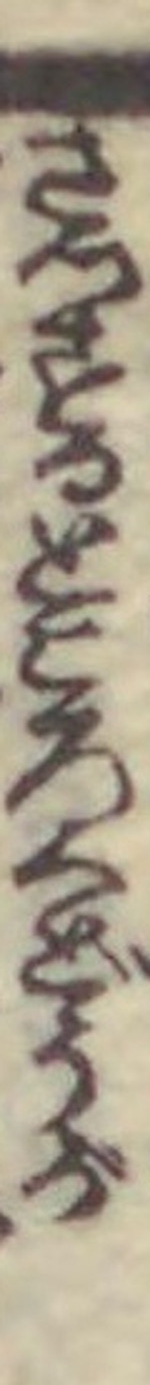さつするところくどうが
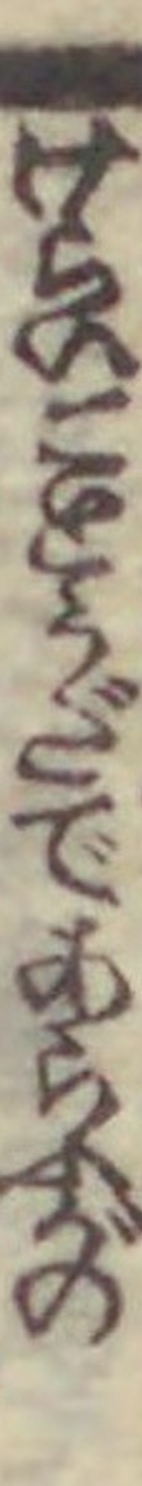けらいことうだであらふがの
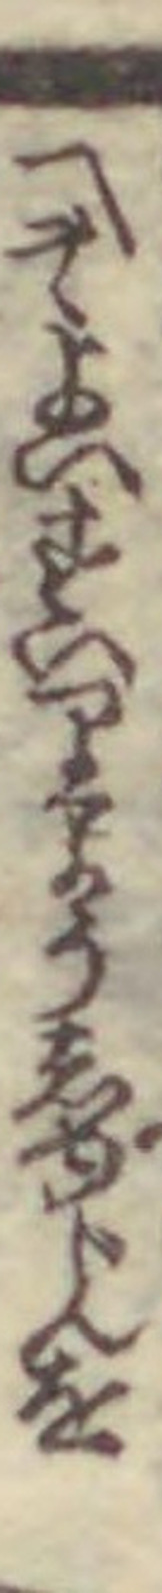〽ヲヽよいすいりようしゆじんを
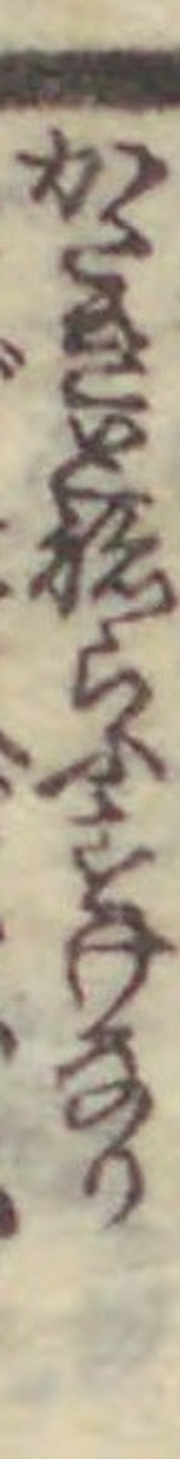かたきとねらふすけなり
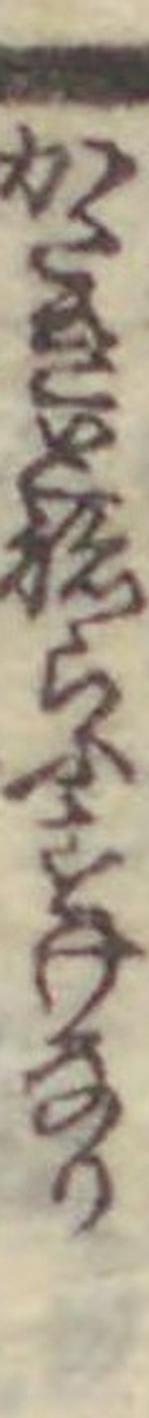かたきとねらふすけなり
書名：大時代唐土化物 3巻. 曽我太夫染
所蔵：国立国会図書館 National Diet Library, JAPAN
